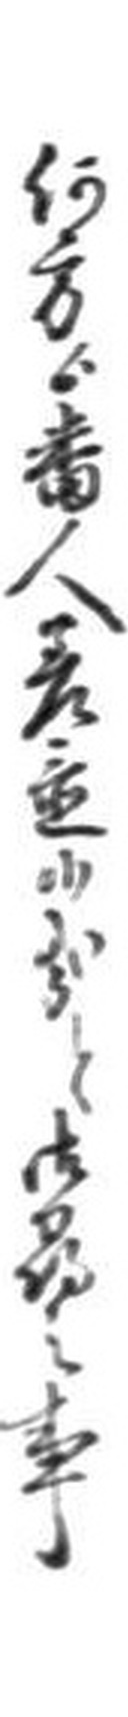何方ゟ番人差置候哉と御尋之事
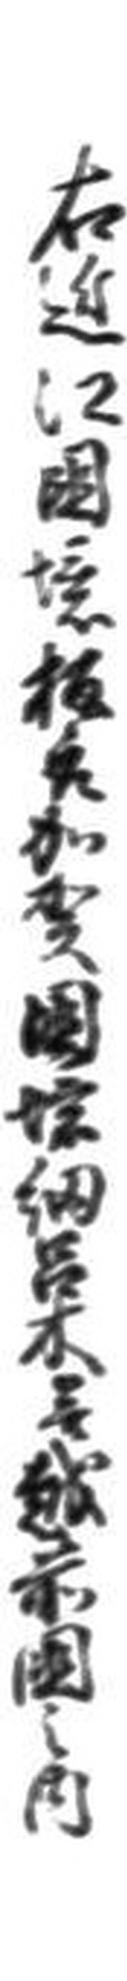右近江国境板取加賀国境細呂木并越前国之内
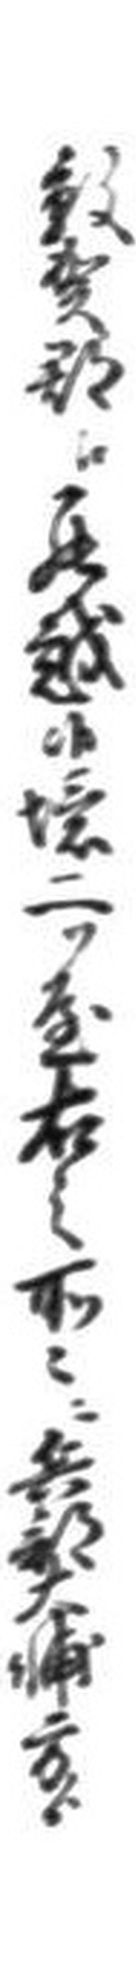敦賀郡江罷越候境ニツ屋右之所々ニ兵部大輔方ゟ
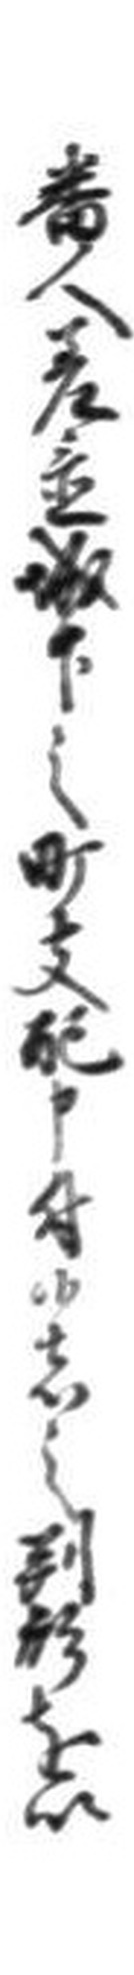番人差置城下之町支配申付候者之判形を以
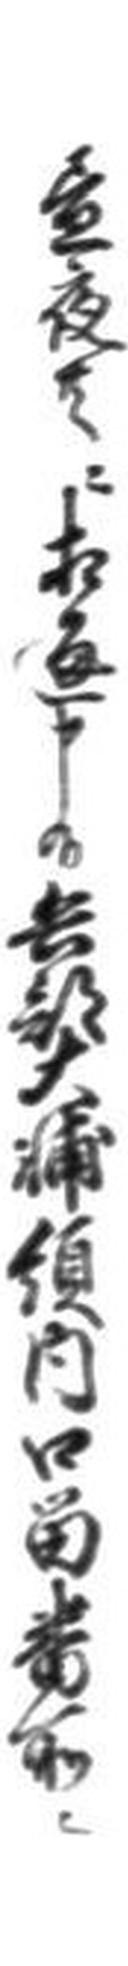昼夜共ニ相通申候兵部大輔領内口留番所ニ
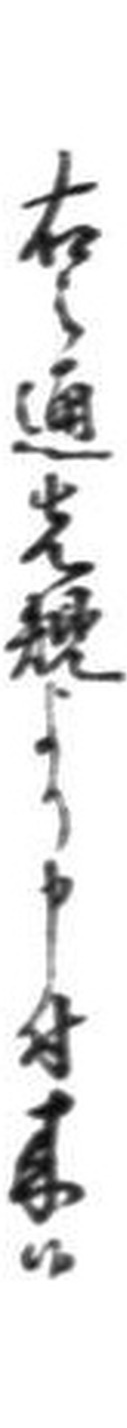右之通先規より申付来候

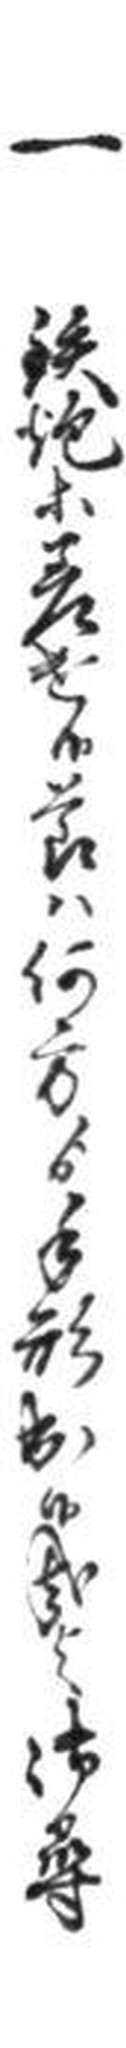一鉄炮等差遣候節ハ何方ゟ手形出候哉与御尋
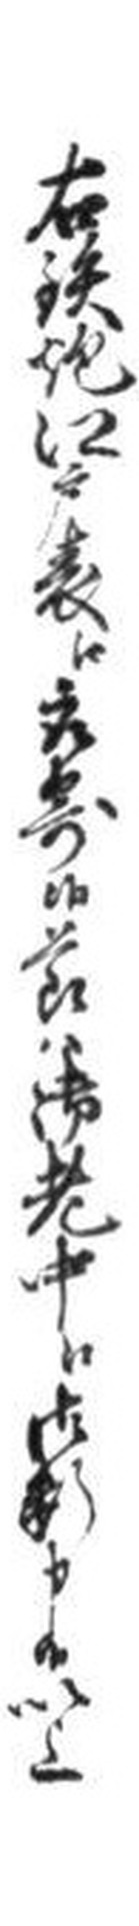右鉄炮江戸表江取寄候節ハ御老中江御断申候以上
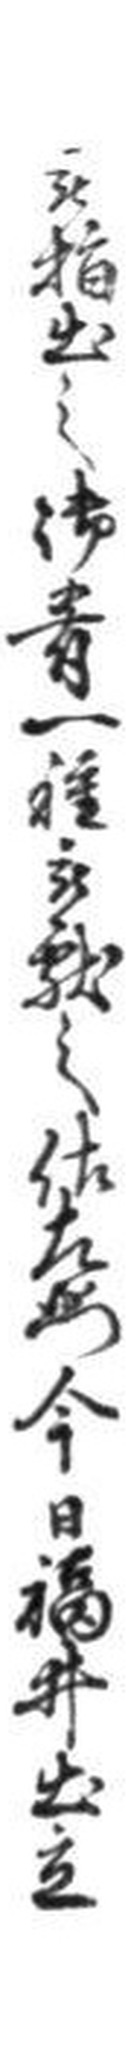被指出之御肴一種被献之佐左衛門今日福井出立
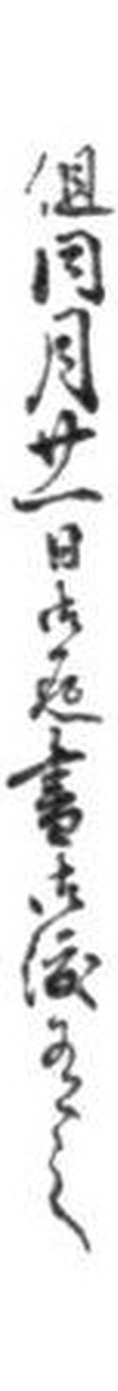但同月廿一日御返書御渡有之
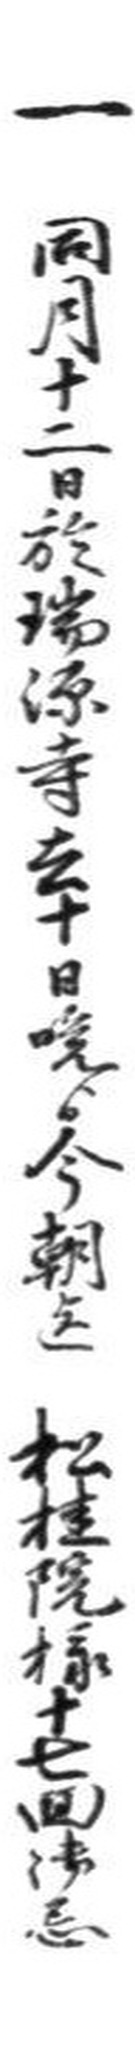一同月十二日於瑞源寺去十日晩ゟ今朝迄松桂院様十七回御忌
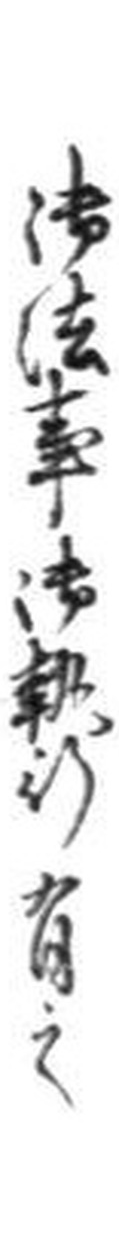御法事御執行有之
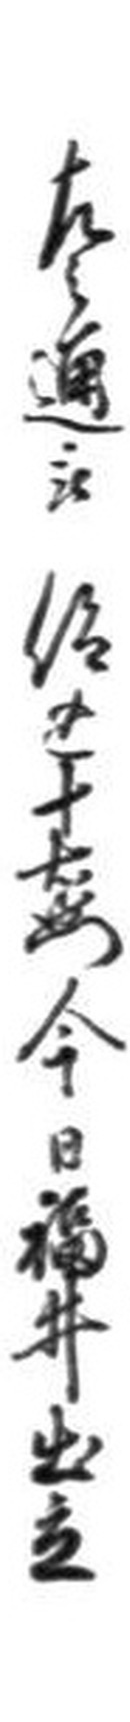左之通被仰込十右衛門今日福井出立
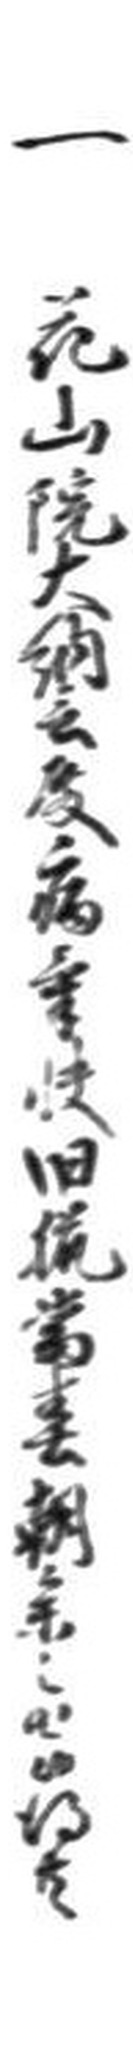一花山院大納言殿病気快旧臘当春朝参之由候得共
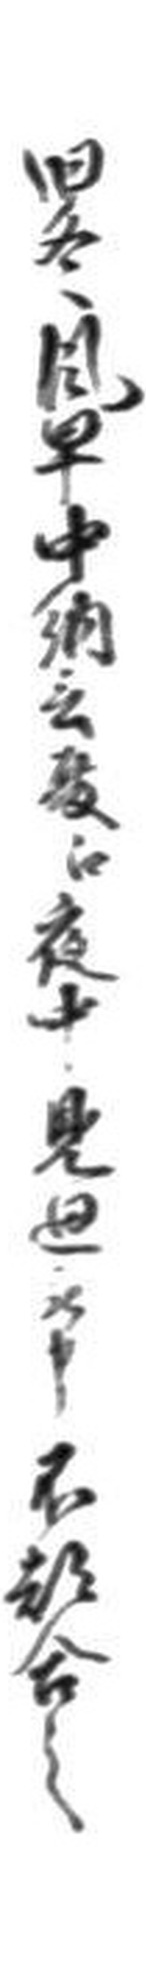旧冬風早中納言殿江夜中見廻被申不都合之
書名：家譜 二十二 吉品公 従元禄十五年到同十六年
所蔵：福井県文書館 Fukui Prefectural Archives
